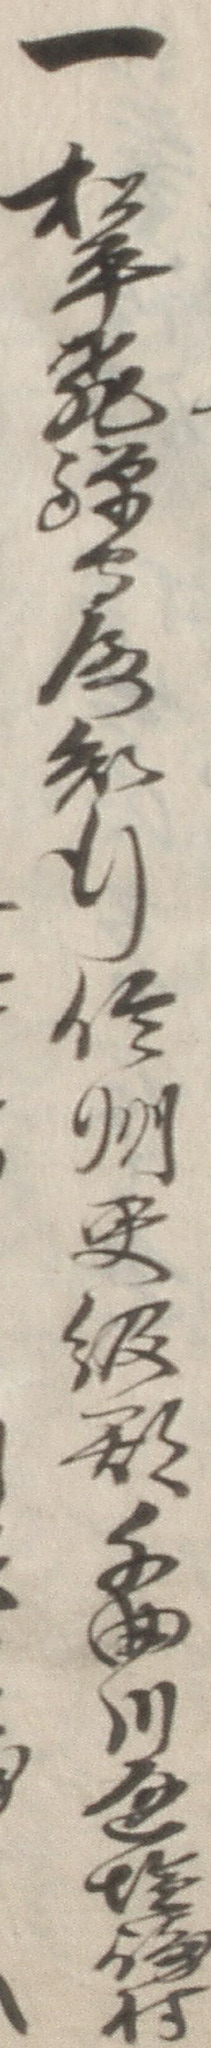一松平飛騨守殿知行信州更級郡千曲川通塩崎村
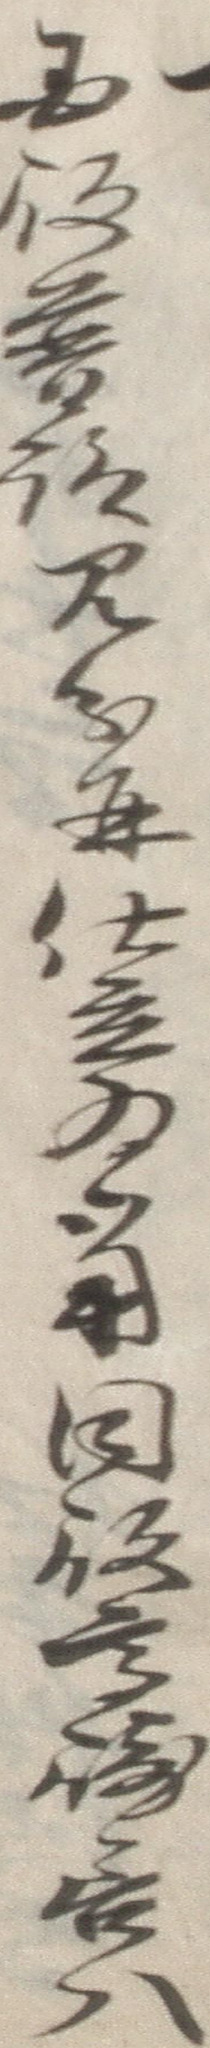国役普請見分并仕立為御用同役高崎善八
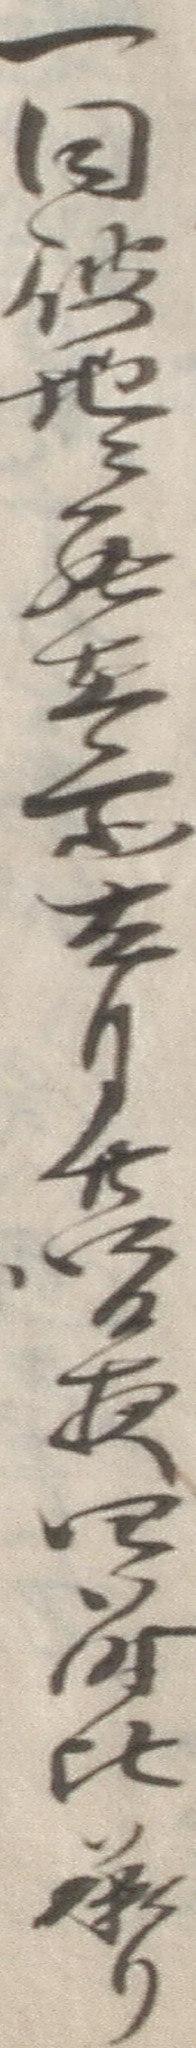一同彼地二罷在候所去月廿四日夜四ッ時比承り
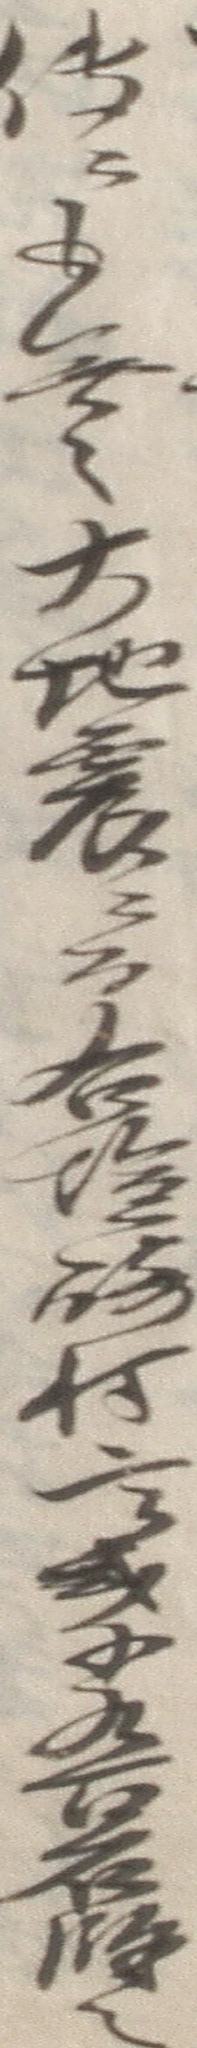伝二も無之大地震二而右塩崎村高弐千九百石餘之
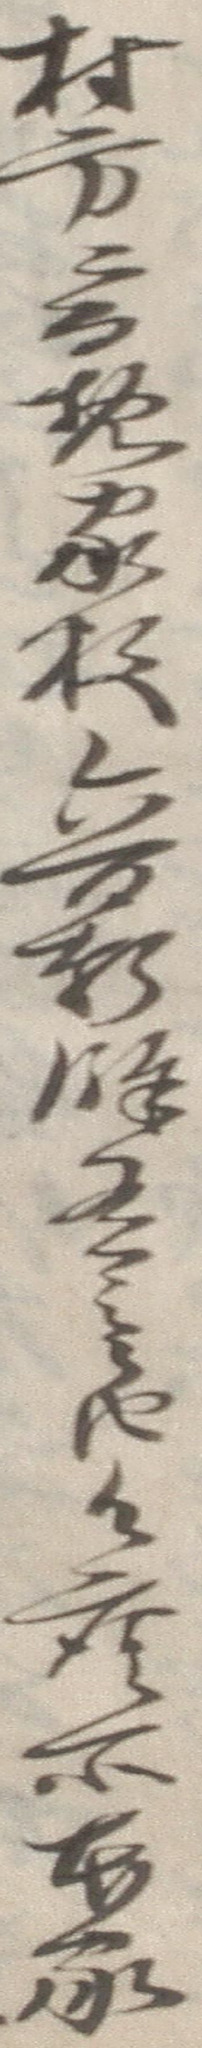村方二而惣家数六百軒餘有之候由御座候所本家
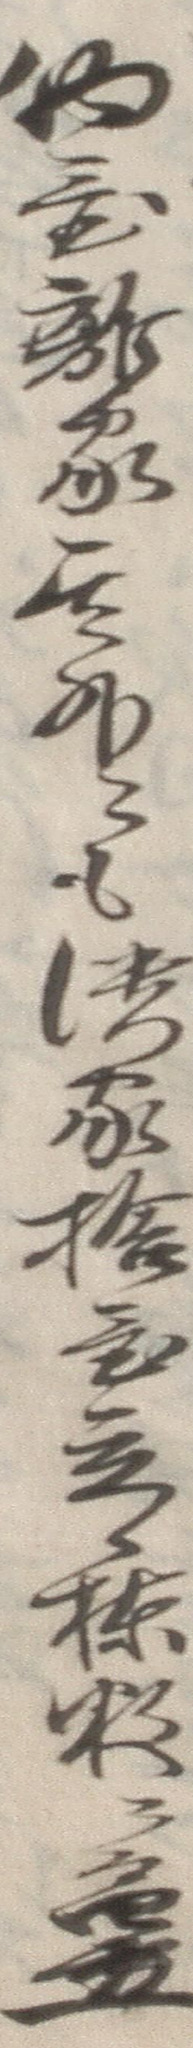物置新家其外二も潰家捨置立候棟数二而四五
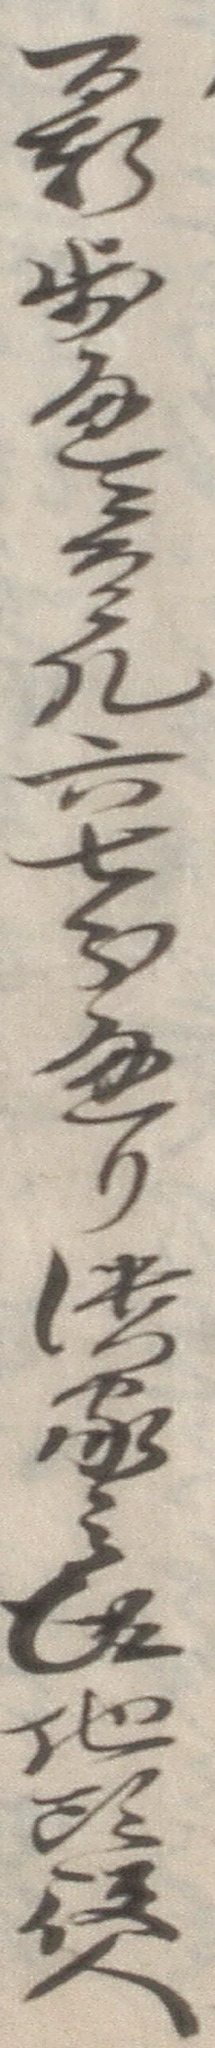百軒歩通二而凡六七分通潰家之趣地頭役人
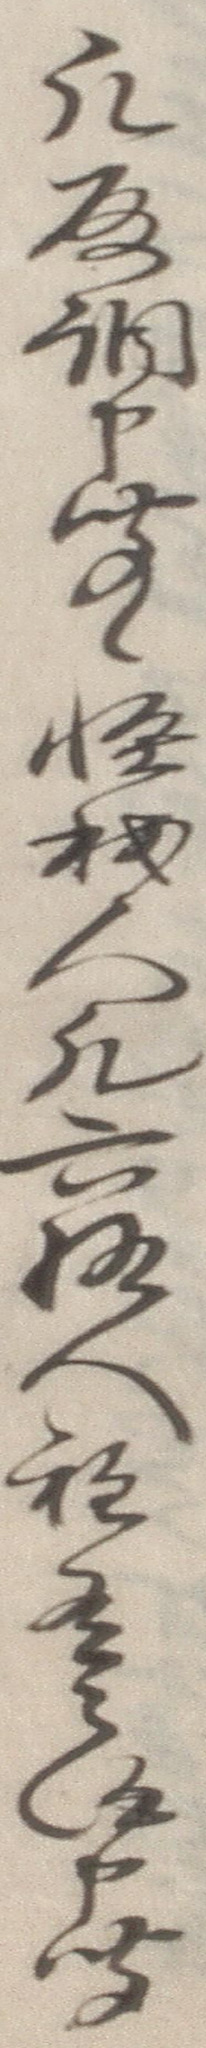凡取調申聞候怪我人凡六拾人程有之趣申聞
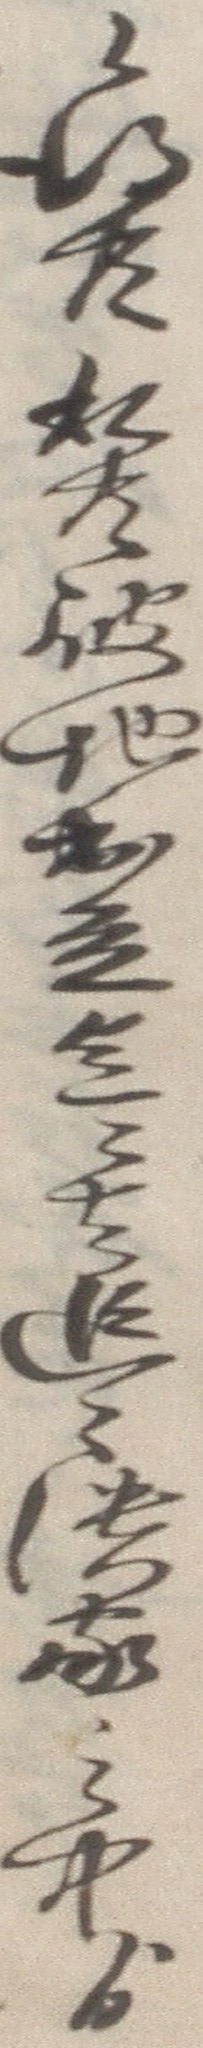候得共私共彼地出立迄二は追々潰家之中ゟ
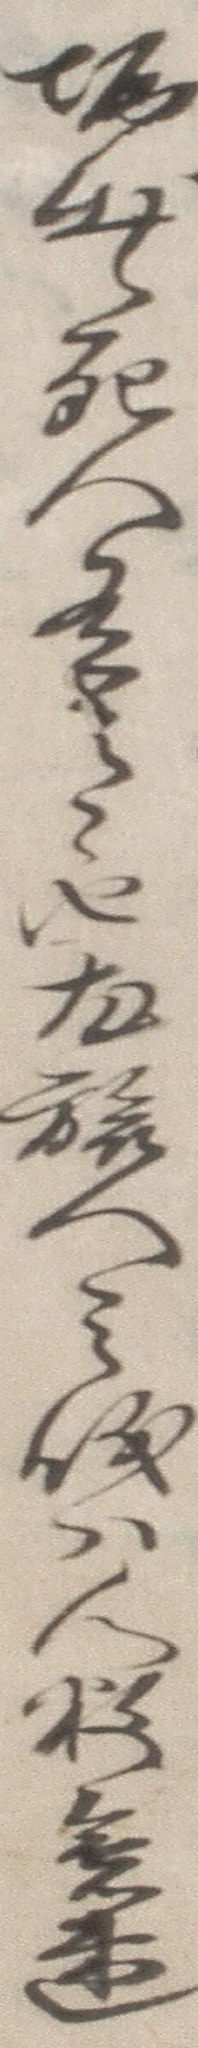掘出候死人有之候由故旅人之儀ハ人数急速
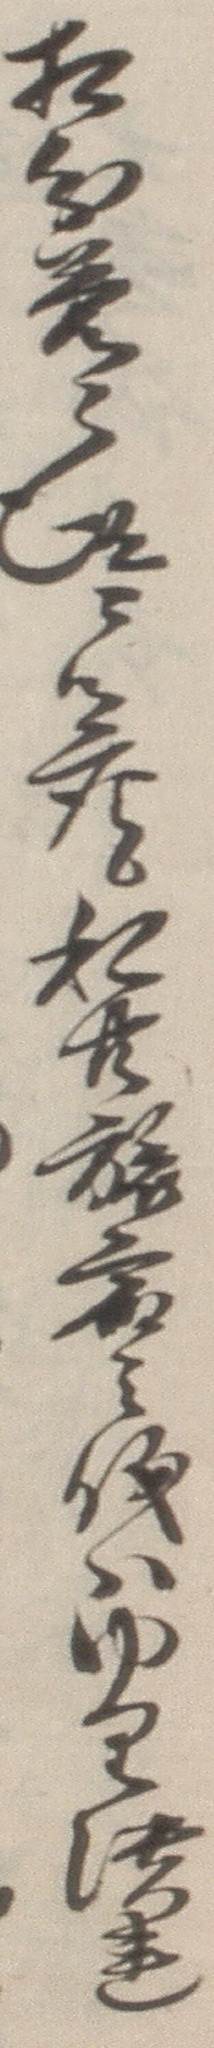相分兼候趣二御座候私共旅宿之儀ハゆり潰れ
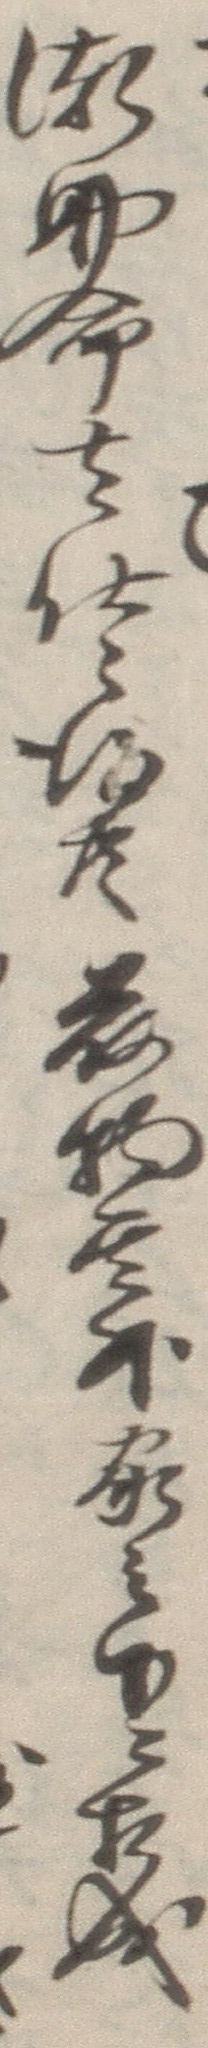漸助命は仕候得共荷物其外家之下二相成
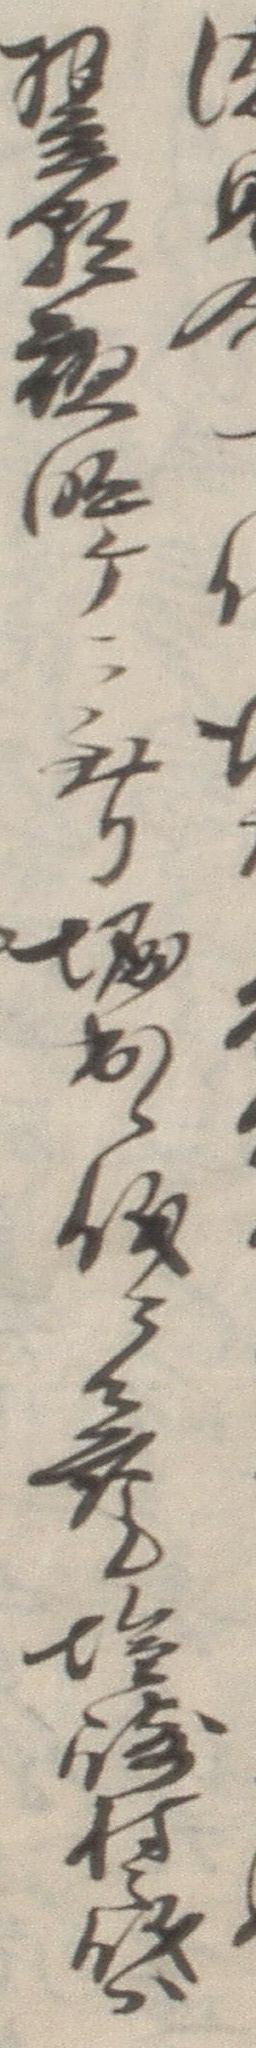翌朝夜明二至り掘出候儀二御座候塩崎村之儀ハ
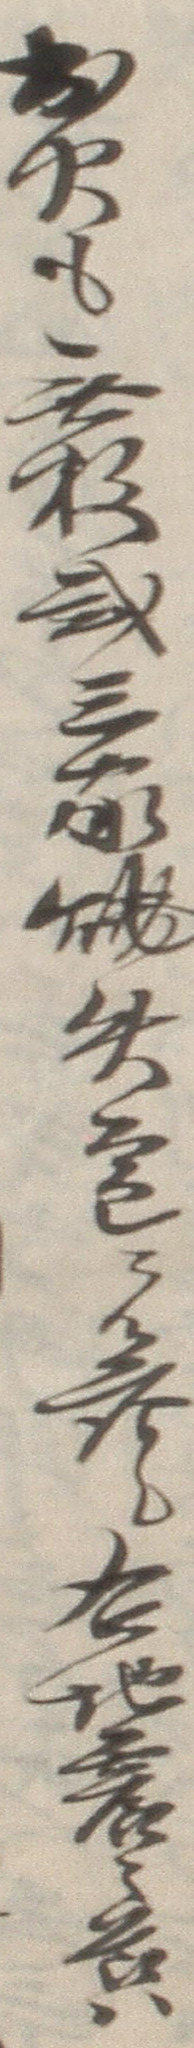出火も無数弐三家焼失而已二御座候右地震之節ハ
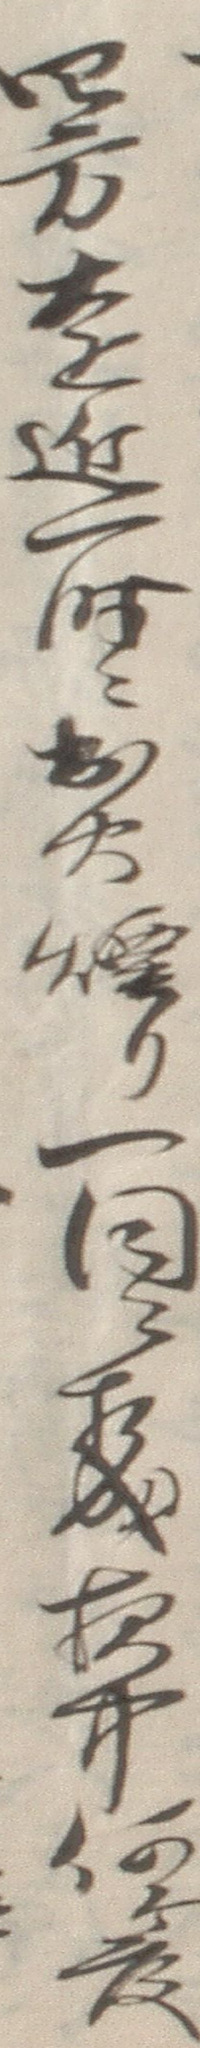四方遠近一時二出火煙り一同二相成夜中何ヶ度
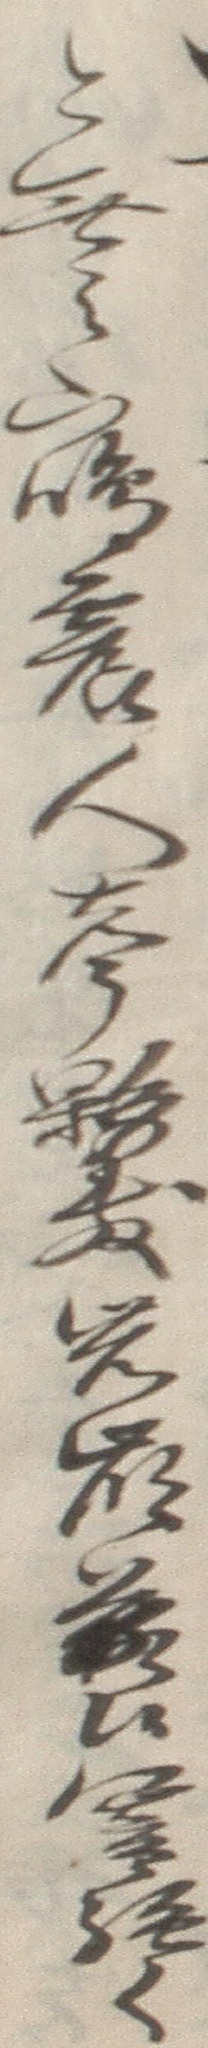と無之山鳴震人声夥敷岩崩落響強く
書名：信州地震一件
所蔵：東京大学地震研究所図書室 Earthquake Research Institute Library, The University of Tokyo, JAPAN
